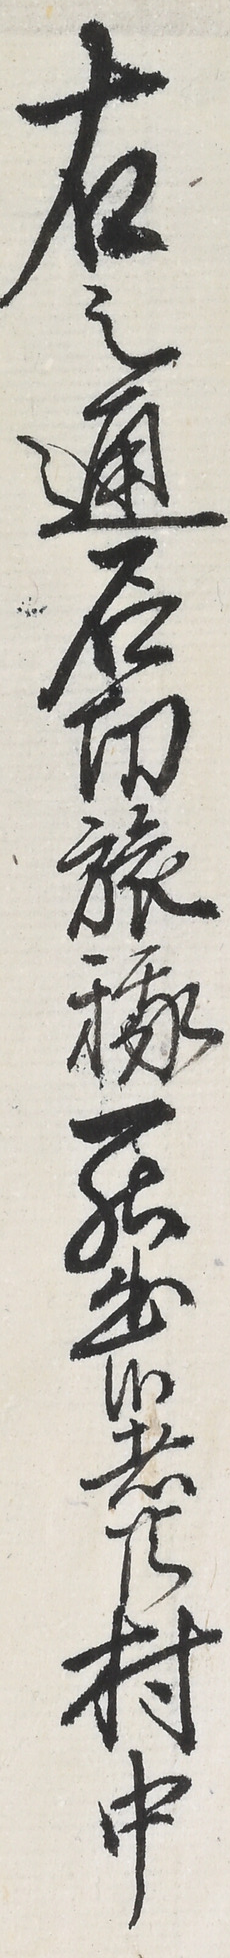右之通石切旅稼罷出候者共村中
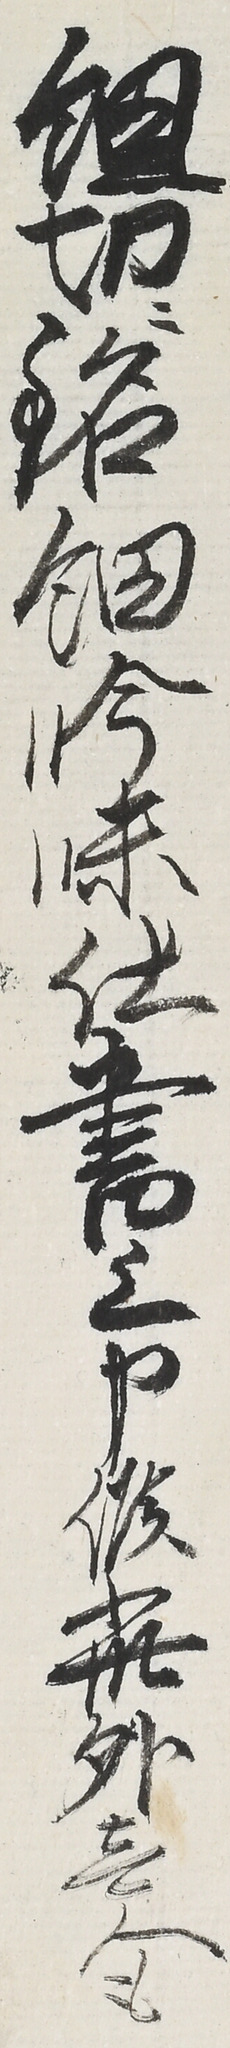組切ニ銘細吟味仕書上申候此外壱人も
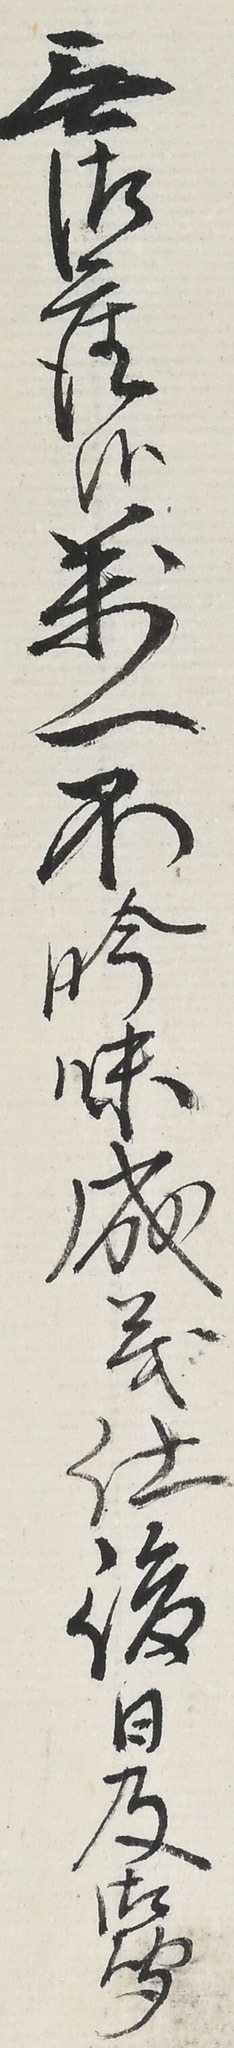無御座候万一不吟味成義仕後日及御聞
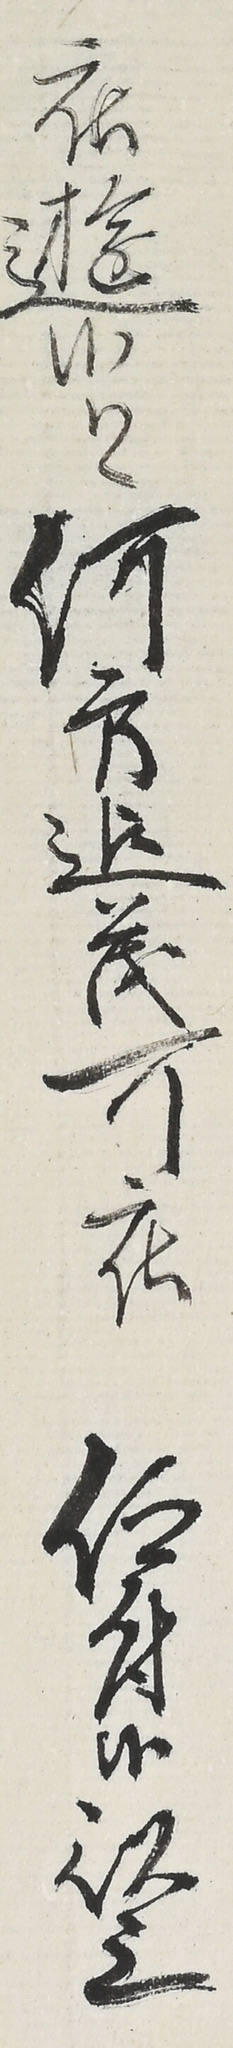被遊候ハヽ何方迄茂可被仰付候以上
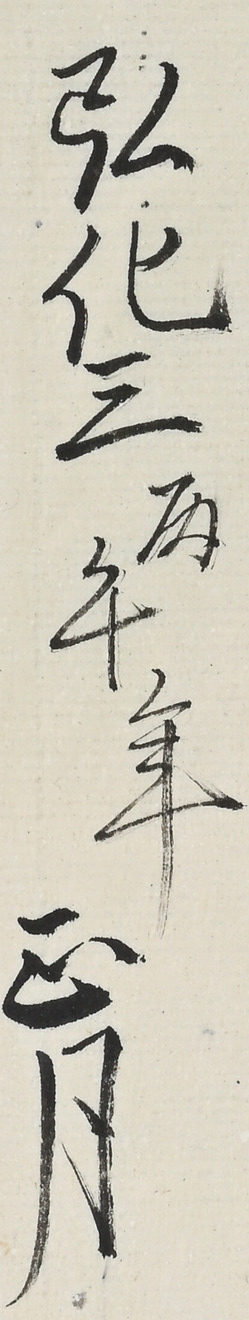弘化三丙午年正月
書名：弘化三丙午年正月他國出石切名前書上帳
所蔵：伊那市立高遠町図書館・合同会社AMANE
